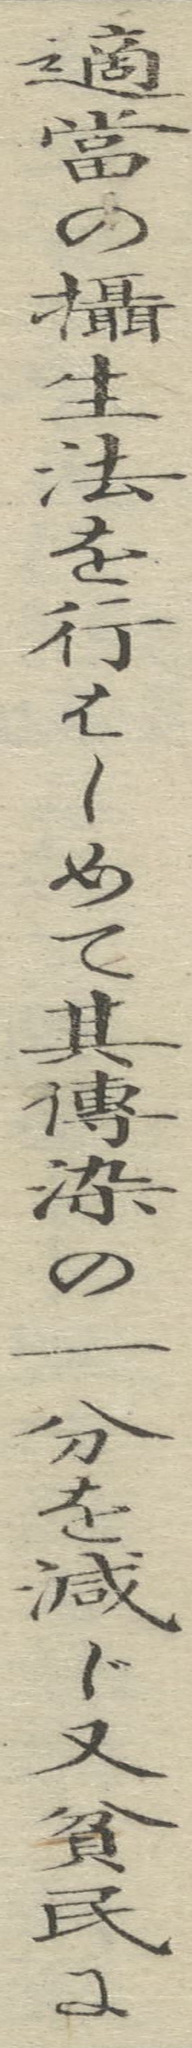適當の攝生法を行はしめて其傅染の一分を減じ又貧民に
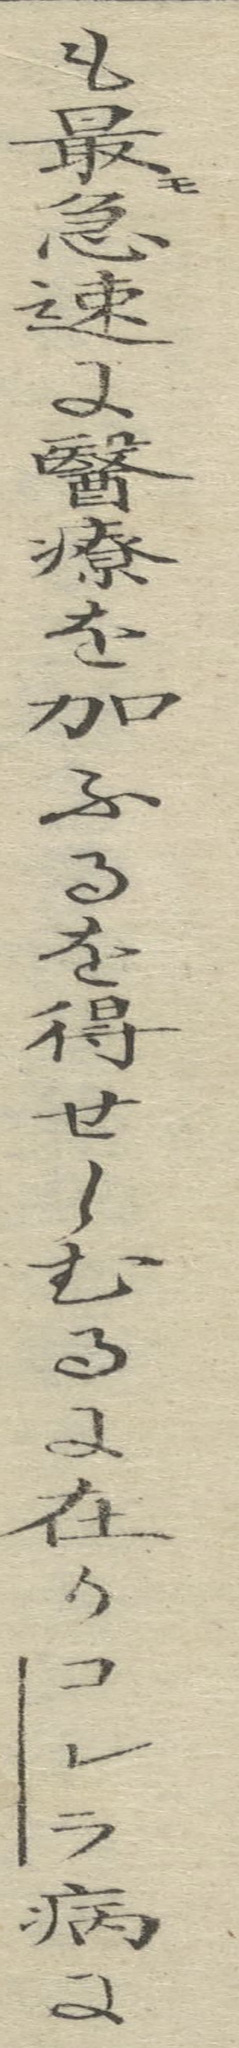も最急速に醫療を加ふるを得せしむるに在りコレラ病に
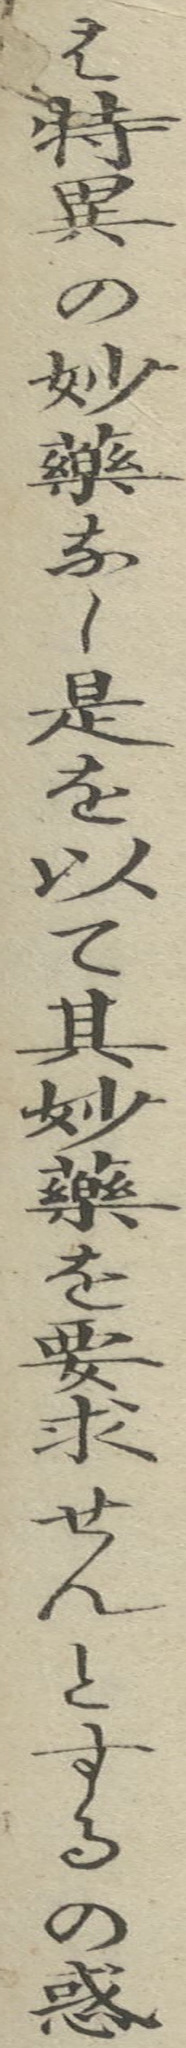は特異の妙藥なし是を以て其妙藥を要求せんとするの惑
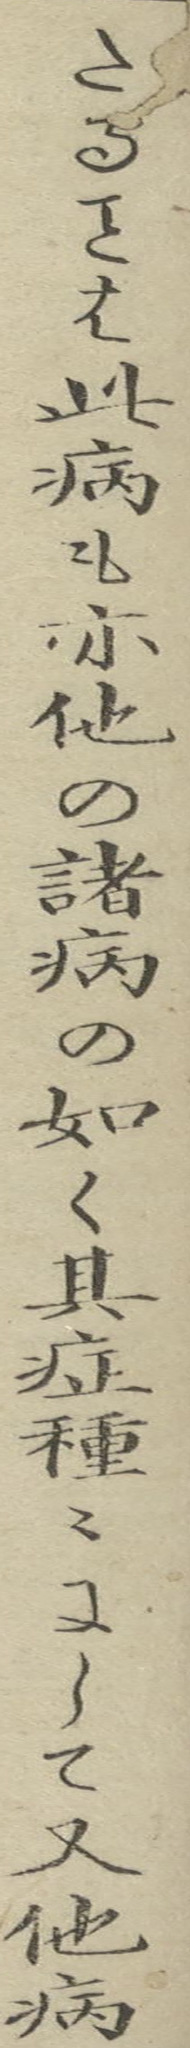たることは此病も亦他の諸病の如く其症種々にして又他病
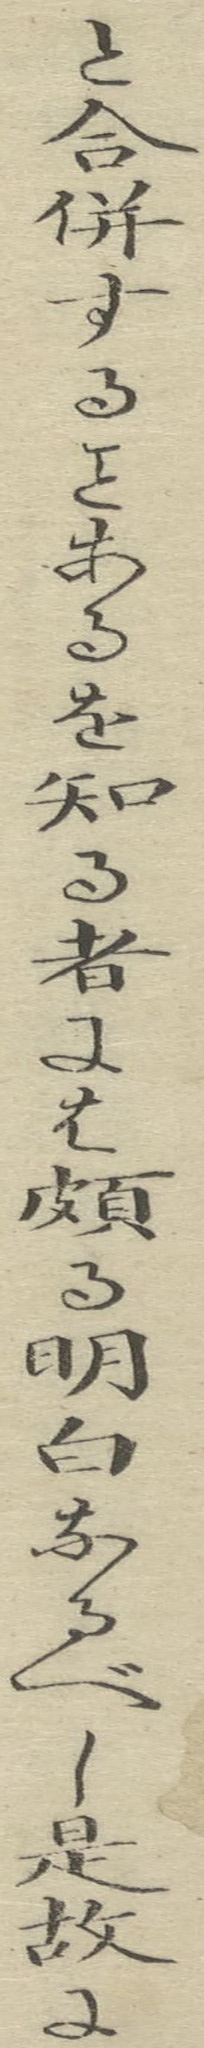と合併することあるを知るには頗る明白なるべし是故に
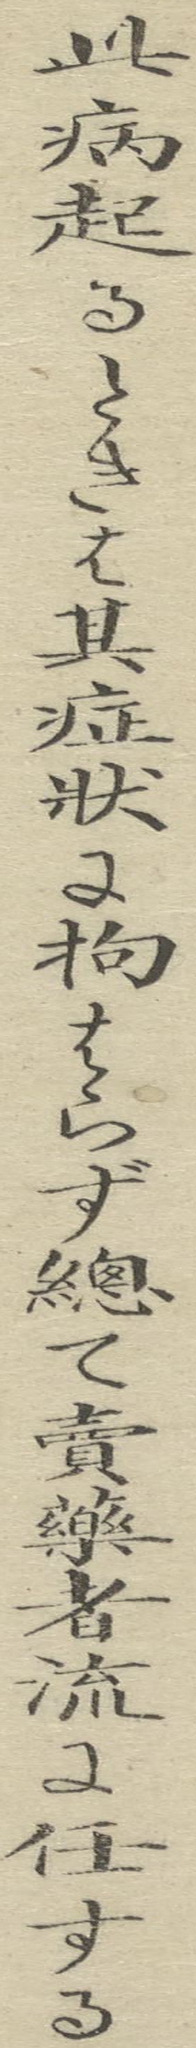此病起るときは其症状に拘はらず總て賣藥者流に任する
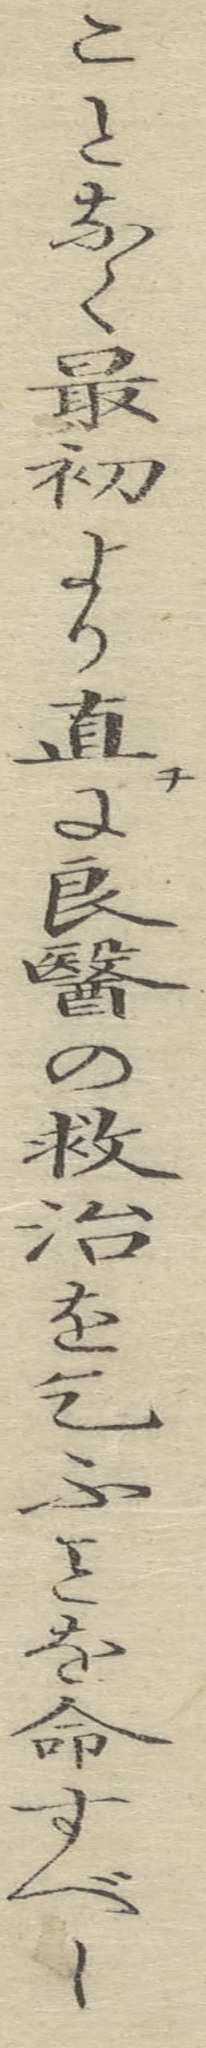ことなく最初より直良醫の救治を乞ふことを命すべし
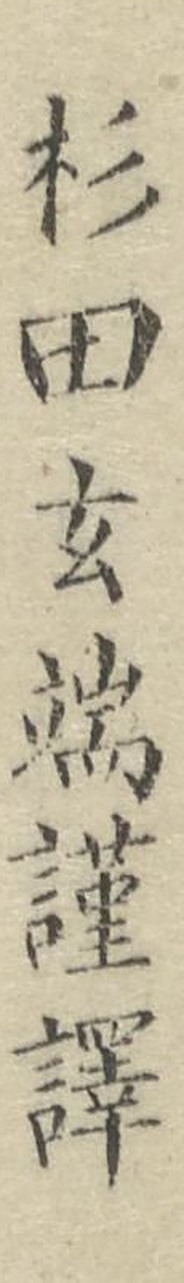杉田玄端謹譯

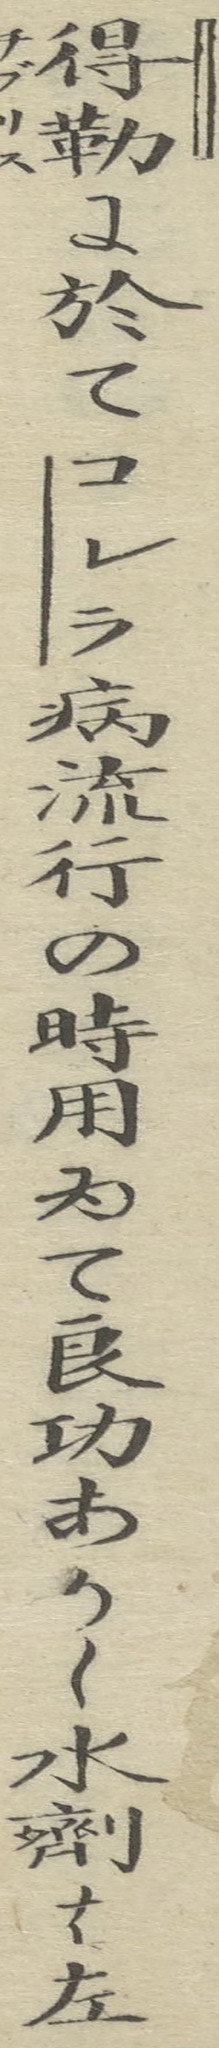得勒に於てコレラ病流行の時用ゐて良効ありし水劑は左
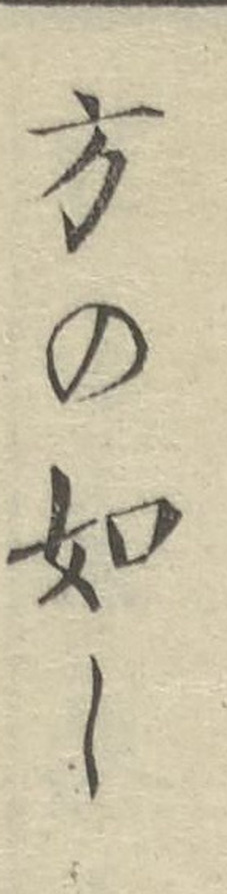方の如し
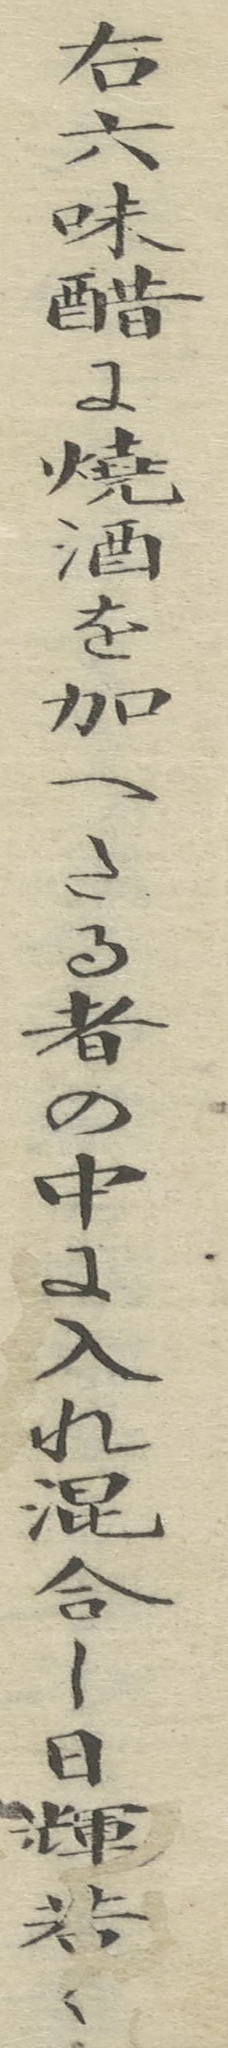右六味醋に焼酒を加へたる者の中に入れ混合し日輝若く
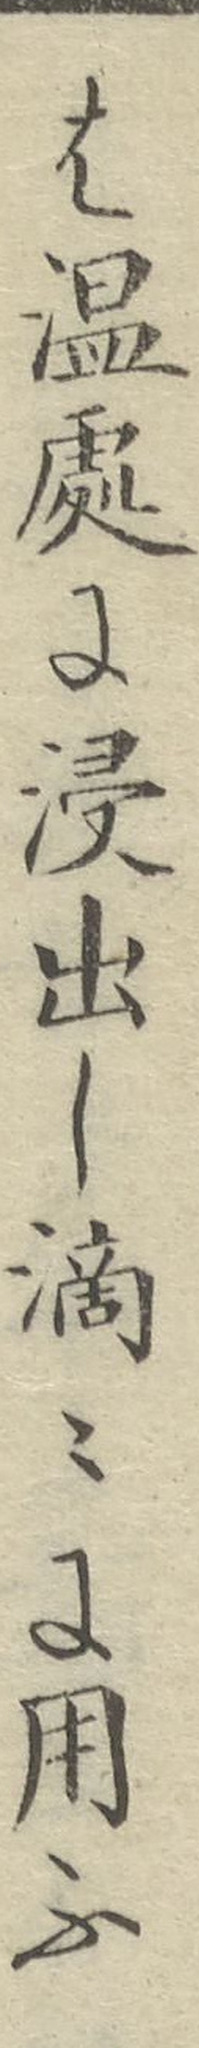は温處に侵出し滴々に用ふ
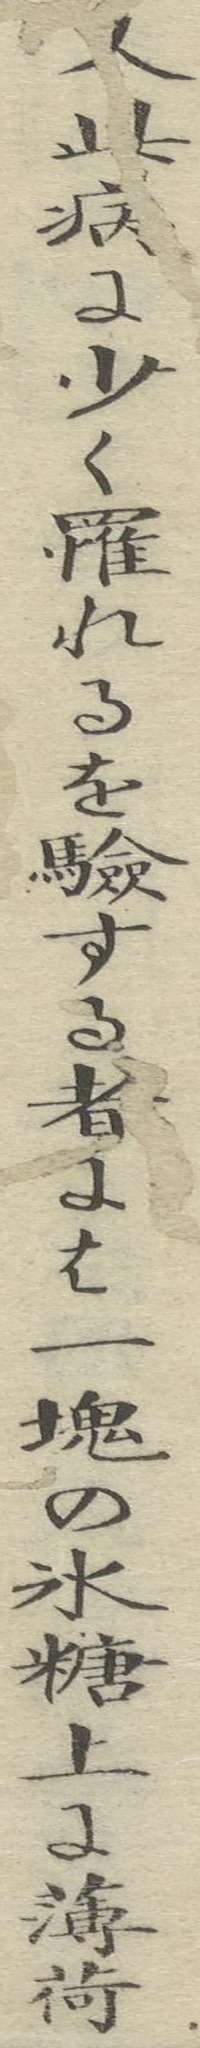又此病に少く罹れるを驗する者には一塊の氷糖上に薄荷
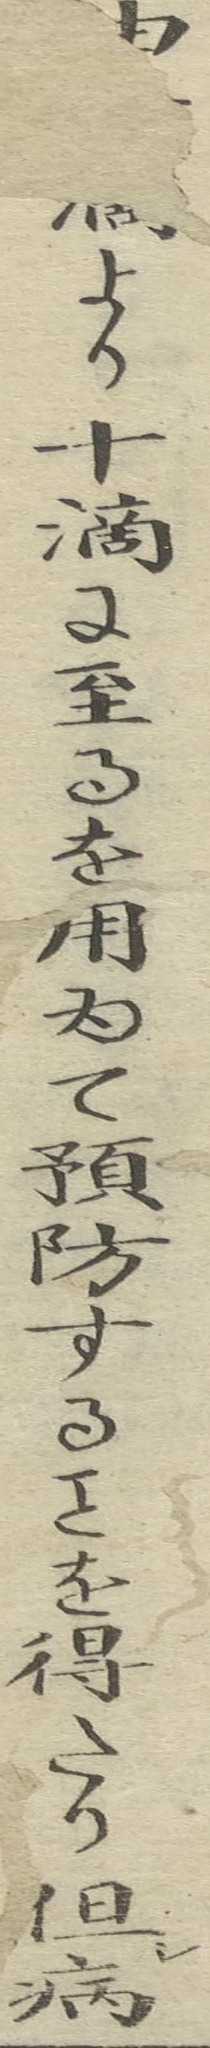滴より十滴に至るを用ゐて預防することを得たり但病
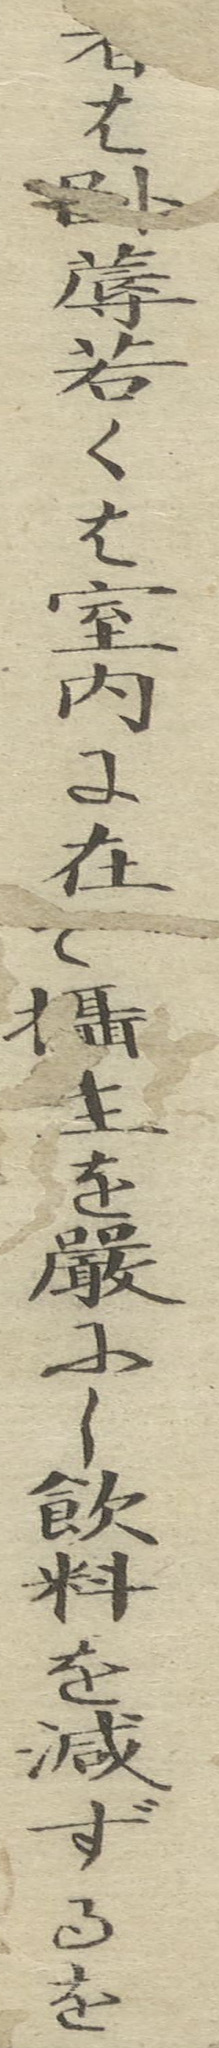者は褥若くは室内に在て欇主を厳にし飲料を減ずるを

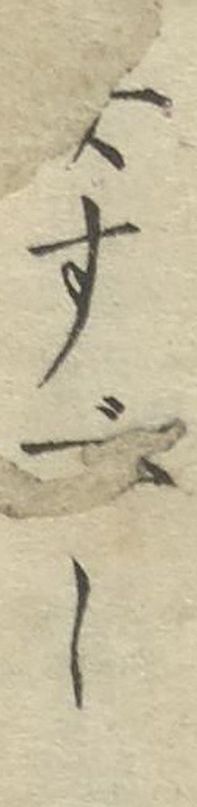すべし
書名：官版疫毒預防説　全
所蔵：東京大学総合図書館 General Library in the University of Tokyo, JAPAN
